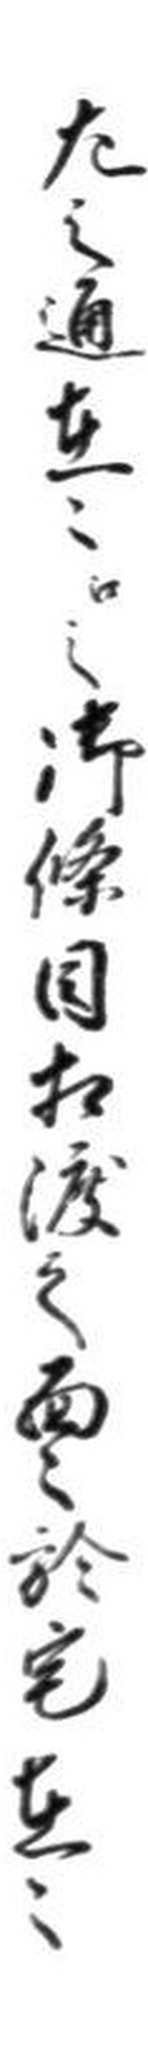左之通在々え之御条目相渡之面々於在々
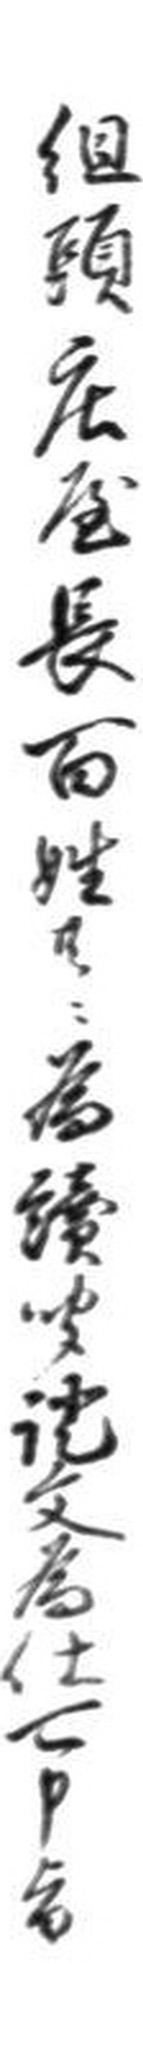組頭庄長百姓共に為読聞証文為仕可ｍ申旨
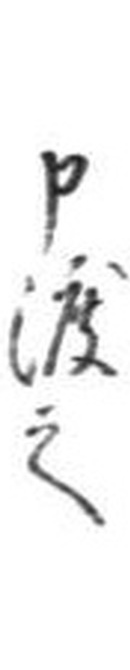申渡之
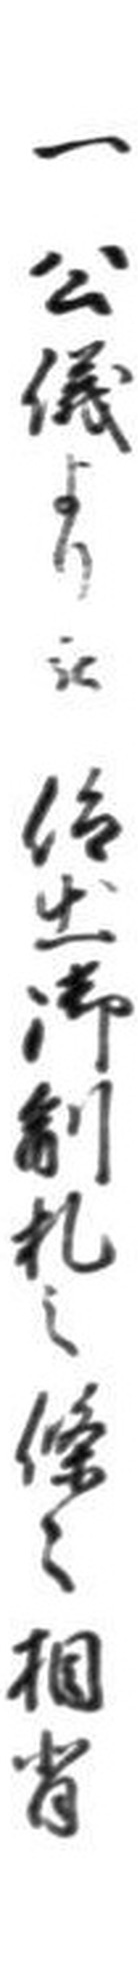一公儀より被仰出御制札之条々相背
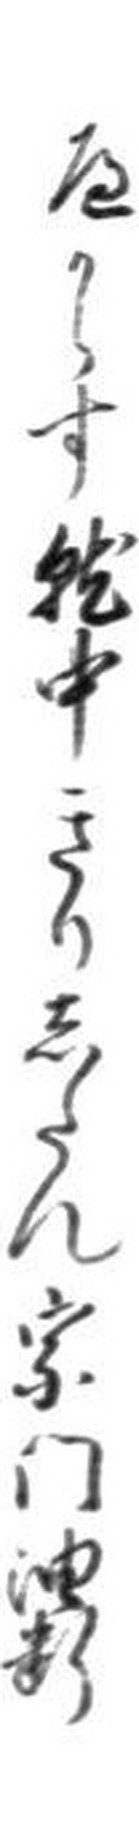へからす就中きりしたん宗門油断
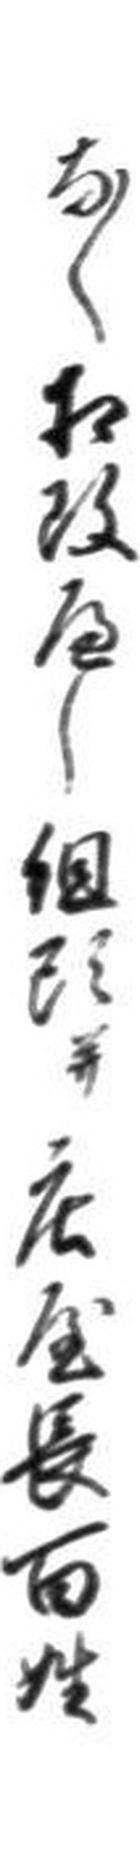なく相改へし組頭并庄屋長百姓
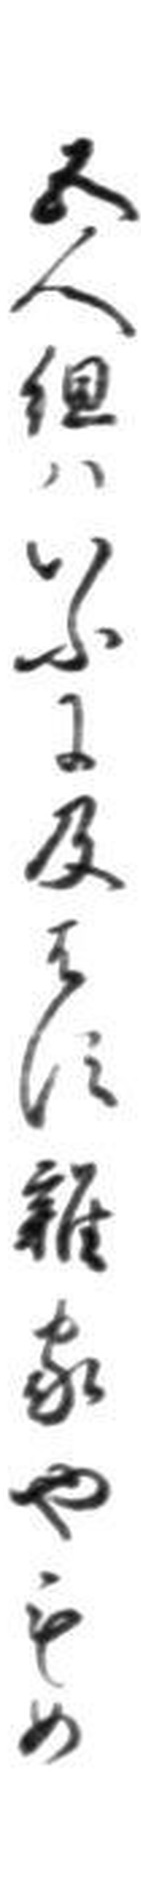五人組はいふに及はす雑家やもめ
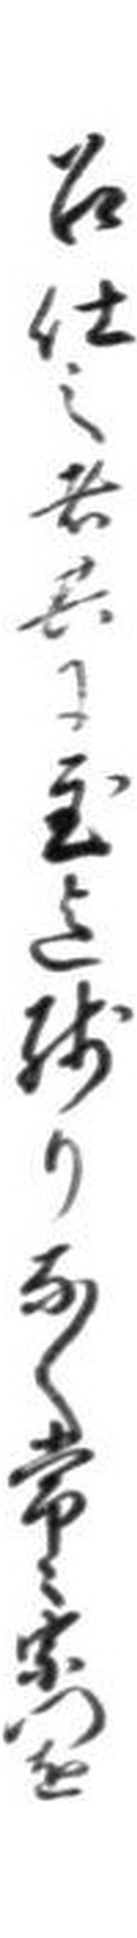召仕之者共に至迄残りなく常々宗門を

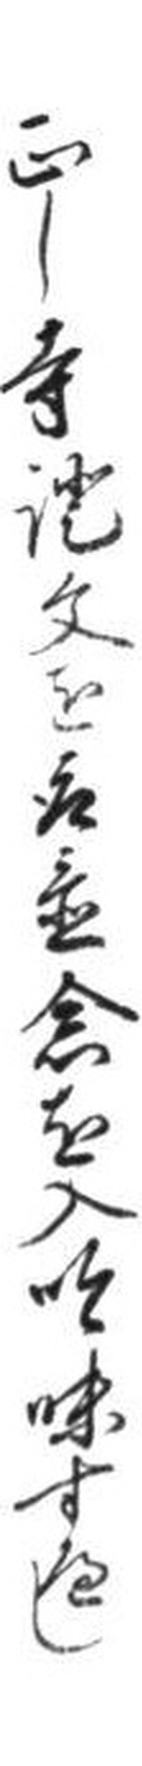正し寺証文を取置念を入吟味すへし
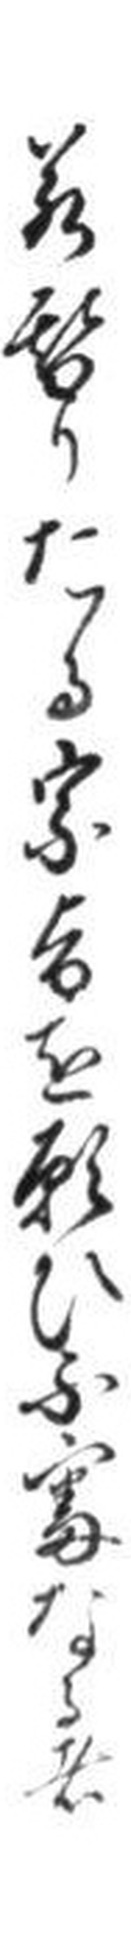若替りたる宗旨を願ひ不審なる者
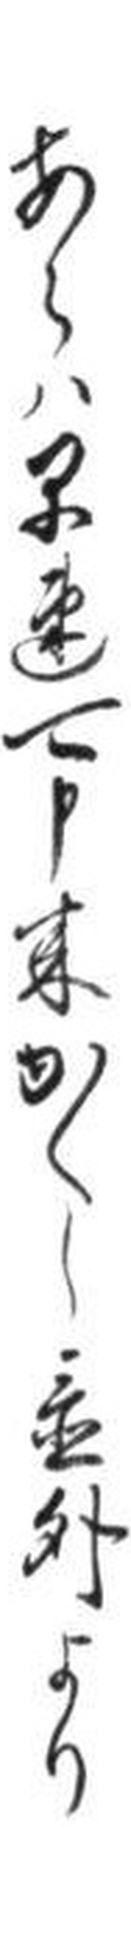あらは早速可申来かくし置外より
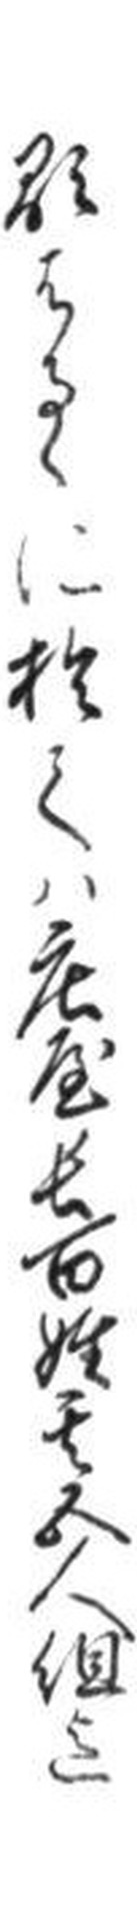顕はるゝに於ては庄屋長百姓其五人組迄
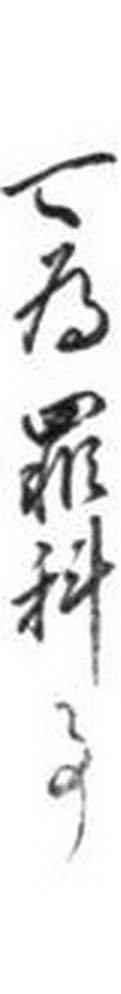可為罪科事
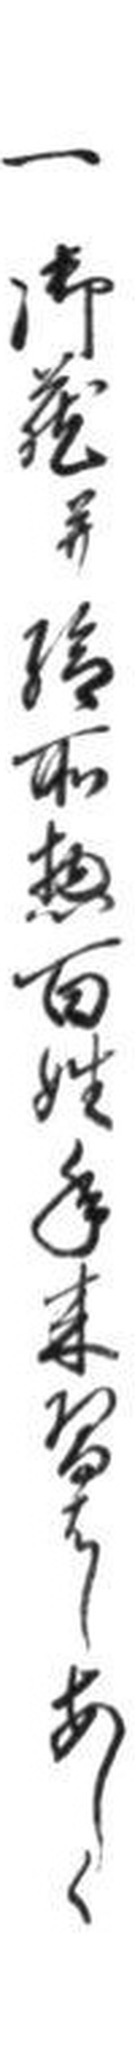一御蔵并給所惣百姓年来習はしあしく
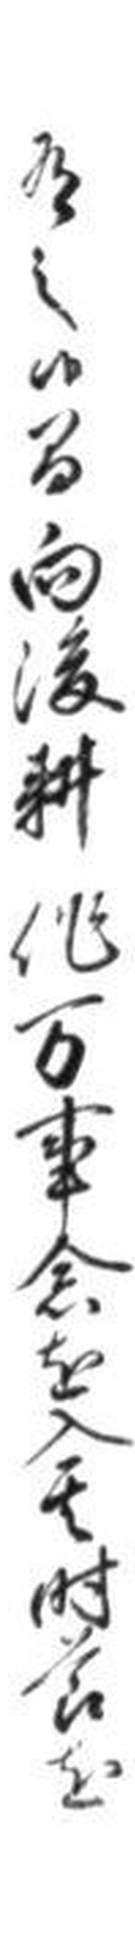有之候間向後耕作万事念を入其時節を
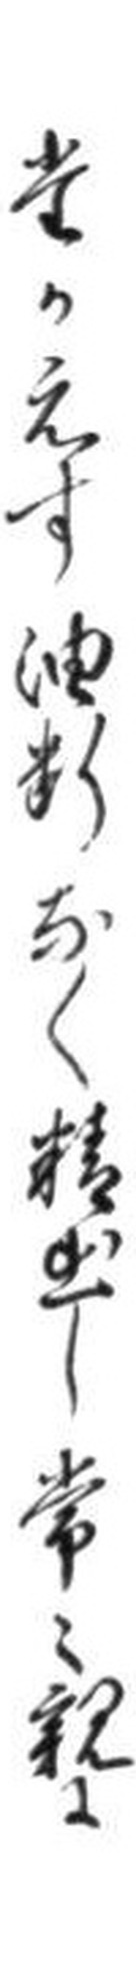たかえす油断なく精出し常々親に
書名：家譜 十六 吉品公 従貞享三年閏三月到同四年
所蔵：福井県文書館 Fukui Prefectural Archives
